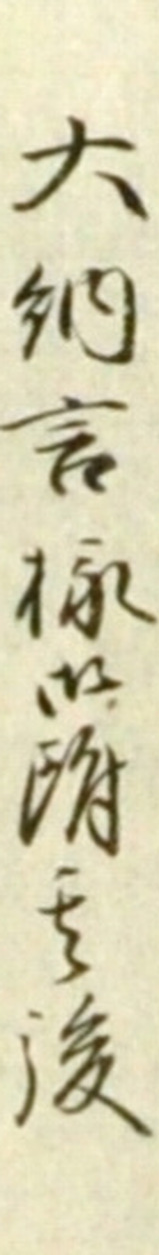大納言様御附其後
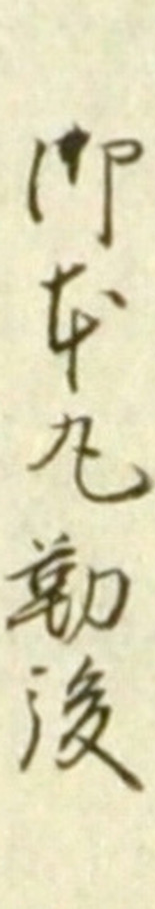御本丸勤後
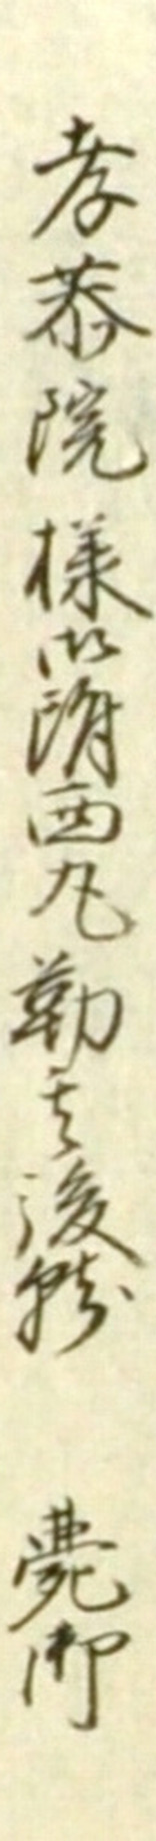孝恭院様御附西丸勤其後就薨御
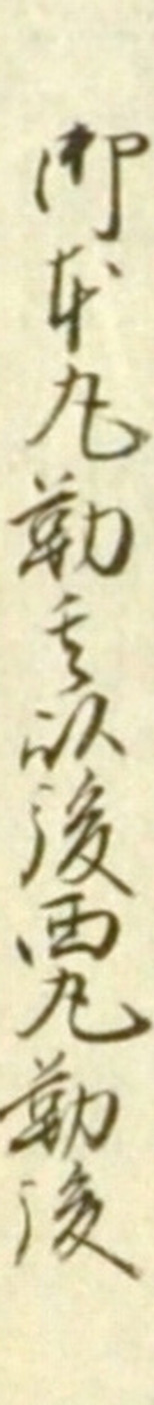御本丸勤其後西丸勤後
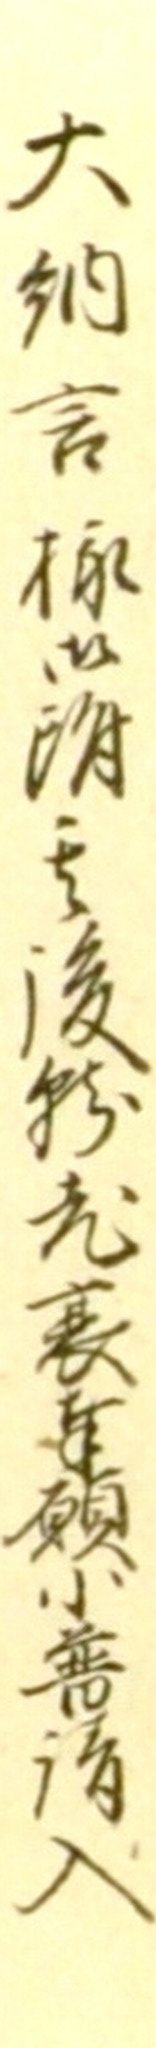大納言様御附其後就老衰奉願小普請入
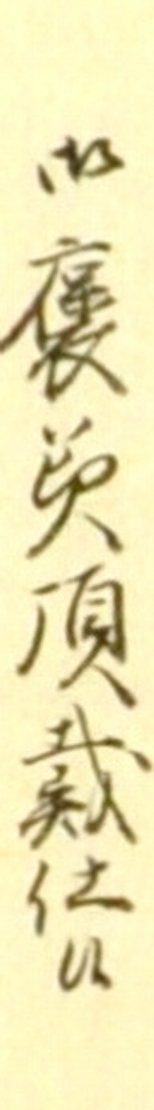御褒美頂戴仕候
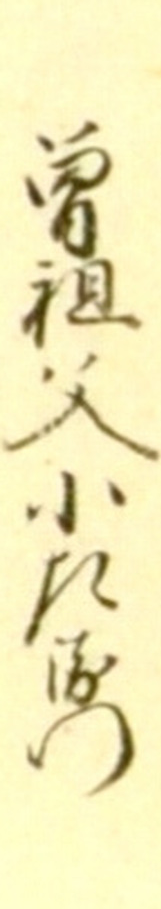曽祖父小左衛門
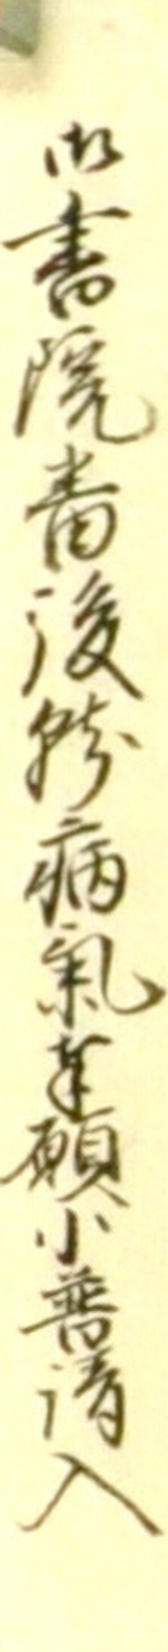御書院番後就病気奉願小普請入

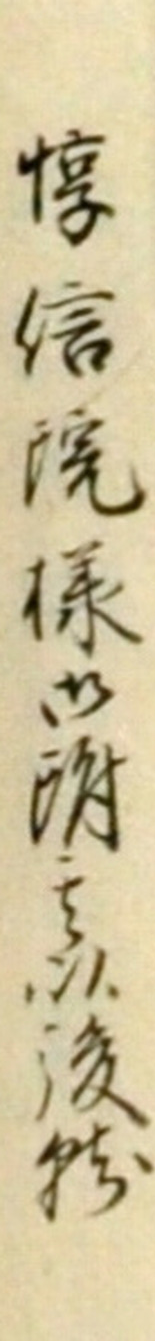惇信院様御附其以後就薨御
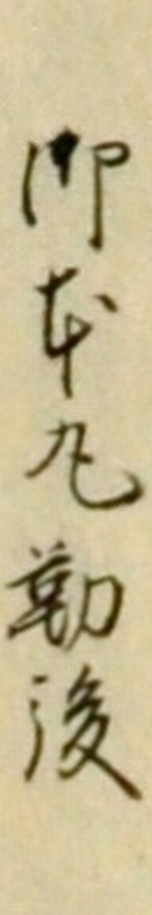御本丸勤後
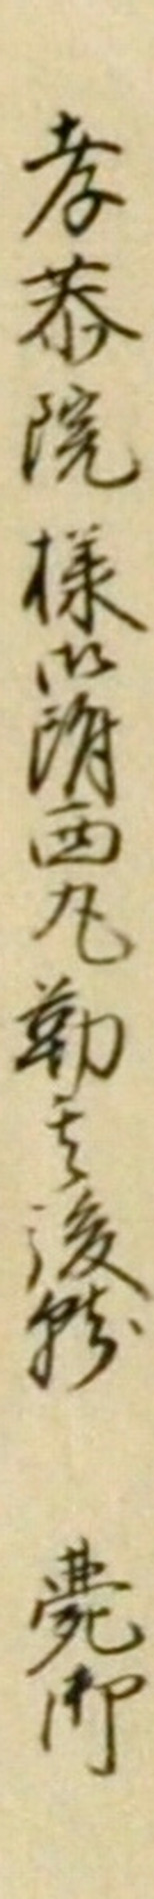孝恭院様御附西丸勤其後就薨御
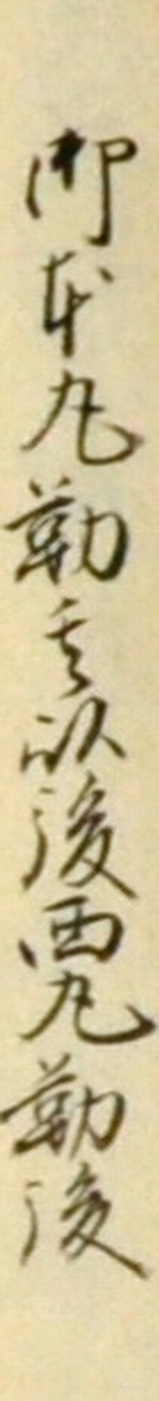御本丸勤其後西丸勤後
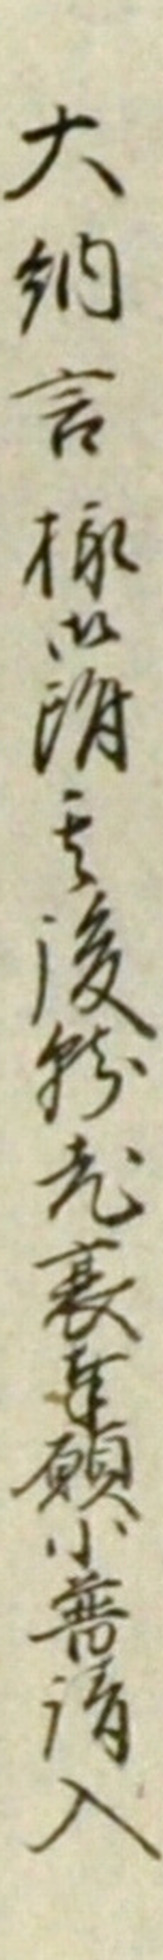大納言様御附其後就老衰奉願小普請入
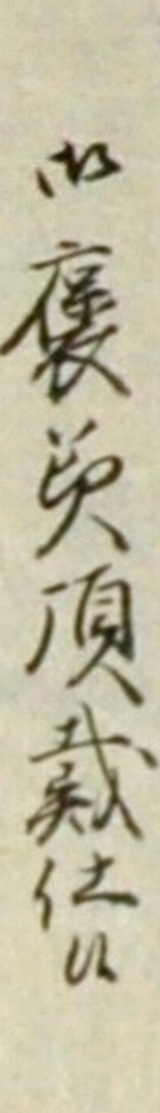御褒美頂戴仕候
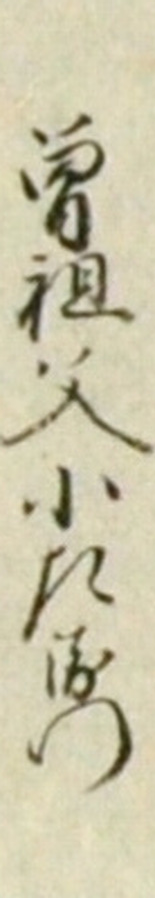曽祖父小左衛門
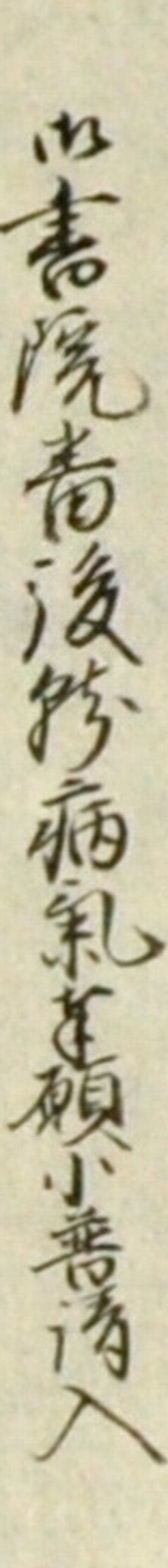御書院番後就病気奉願小普請入
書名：若年寄御役中御調書付
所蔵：伊那市立高遠町図書館・合同会社AMANE
